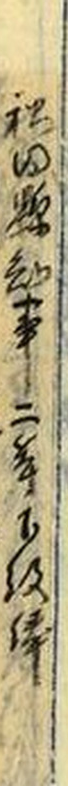秋田県知事二等下級俸
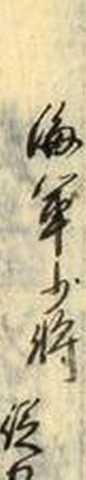海軍少将

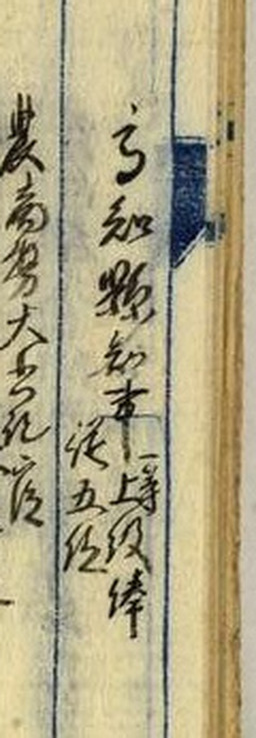高知県知事一等上級俸
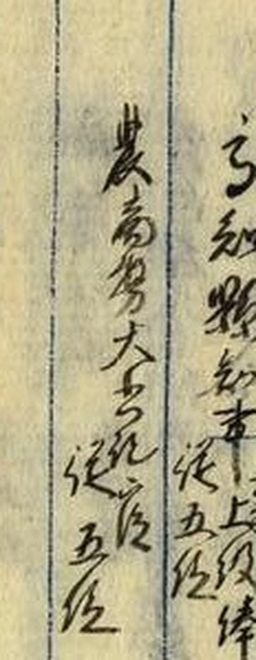農商務省大書記官
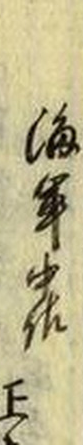海軍中佐
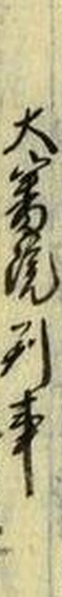大審院判事
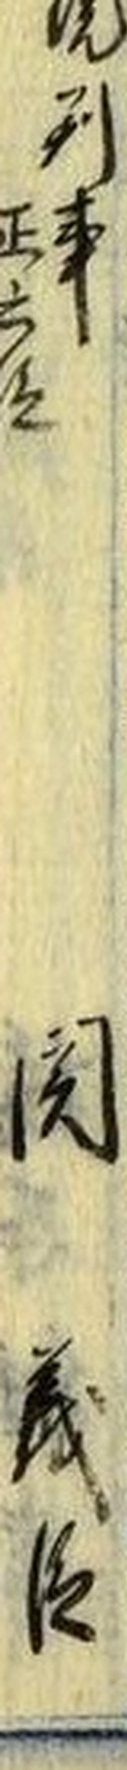正六位関義臣
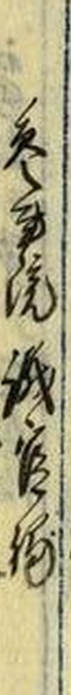参事院議官補
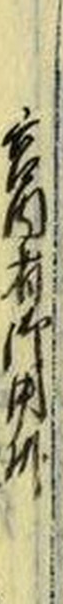宮内省御用掛
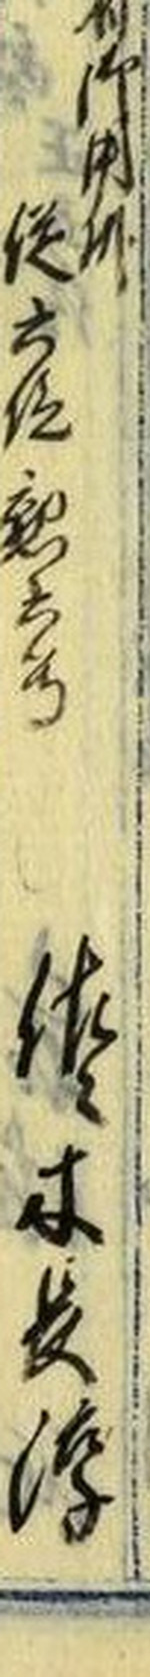従六位勲六等佐々木長淳
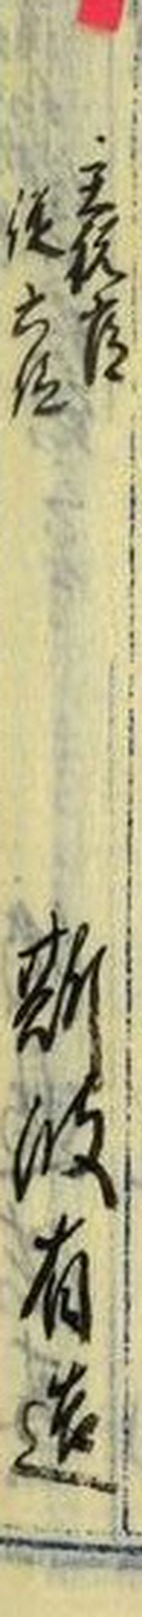従六位斯波有造
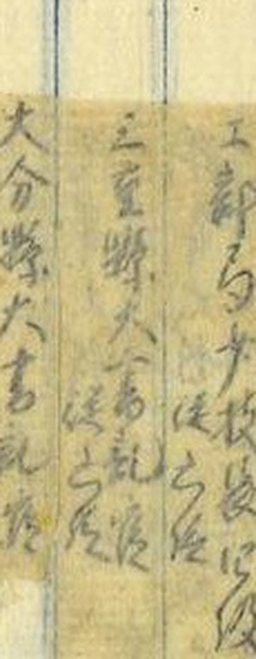長崎県大書記官
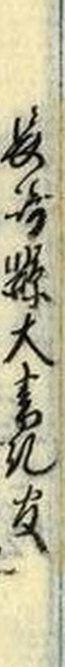長崎県大書記官
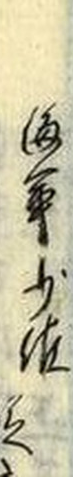海軍少佐
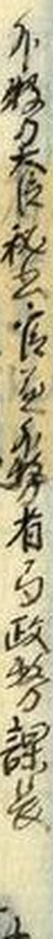外務大臣秘書官兼外務省局政務課長
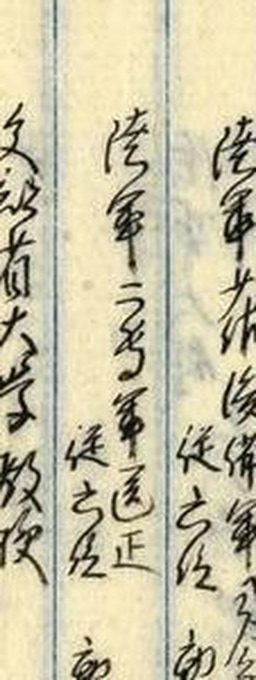陸軍二等軍医正
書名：温古集 三巻
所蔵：福井県文書館 Fukui Prefectural Archives
